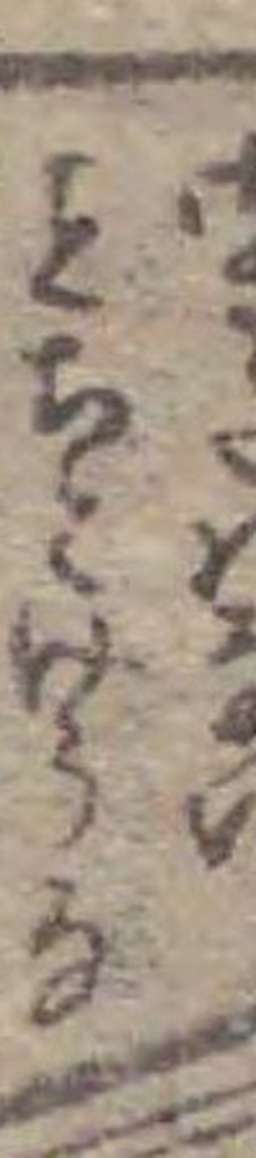ことちとけうな
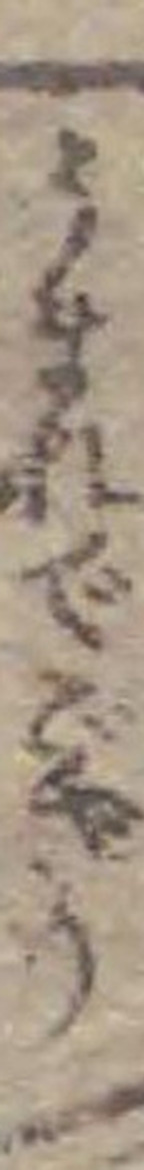うまれでござり
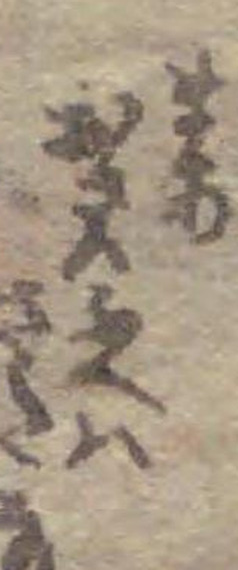おさんふへは
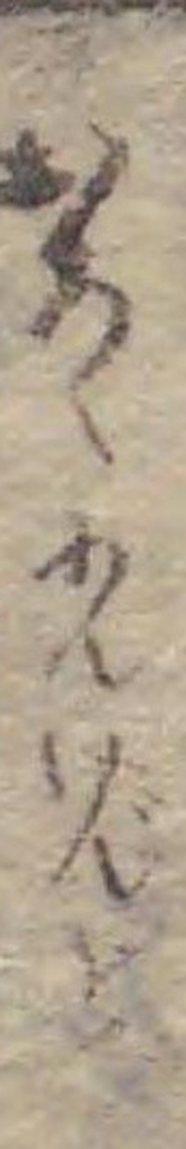おろくにんげんを
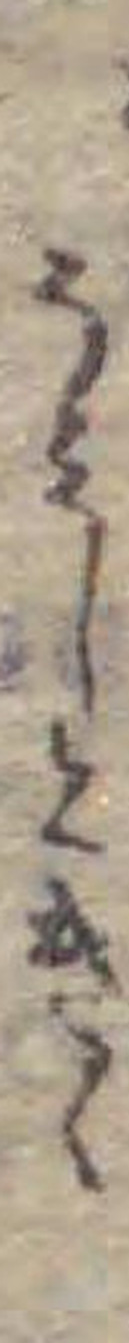うみしときく
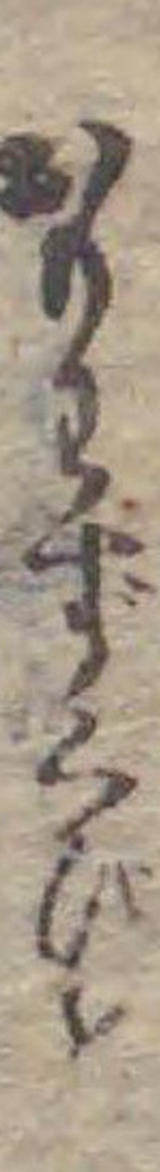おもわずくびを
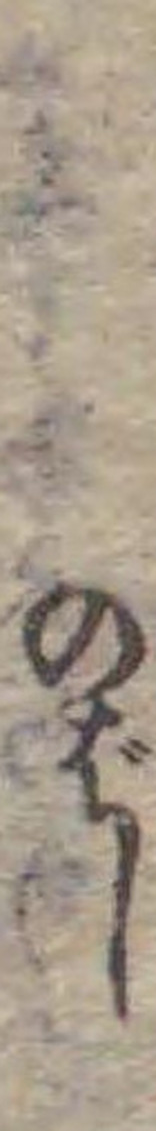のばし
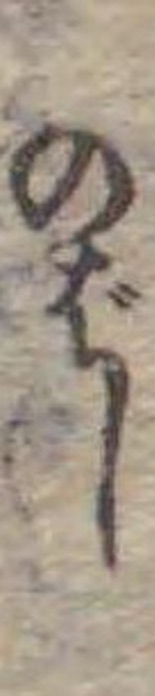のばし
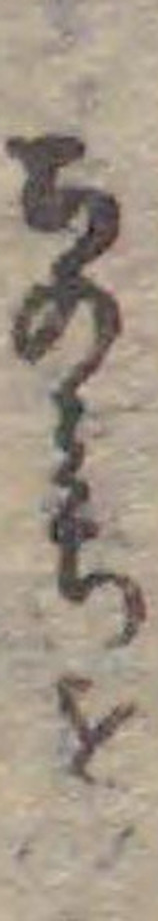ちのみちを

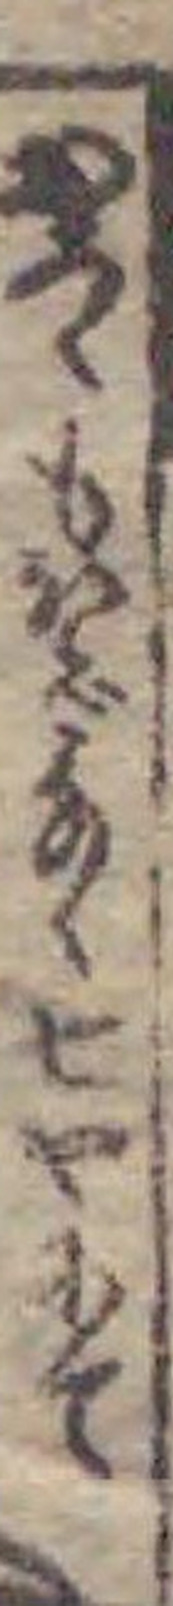おろくもほどなく七やにて
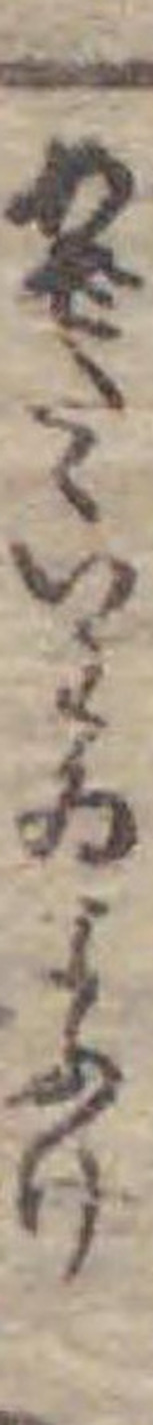めでたくいわゐよふけ
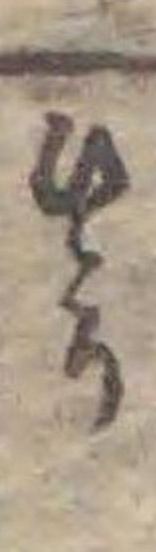ひとり
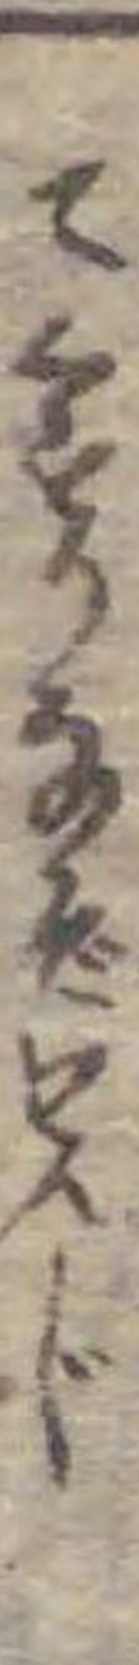てくすりなぞせんじ
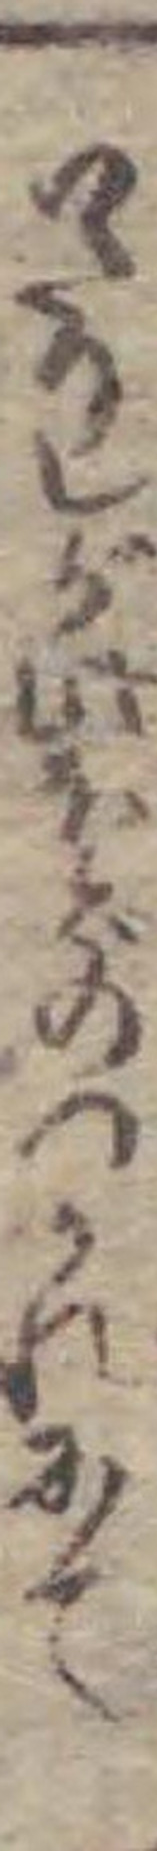つくりしが此ほどのつかれにて
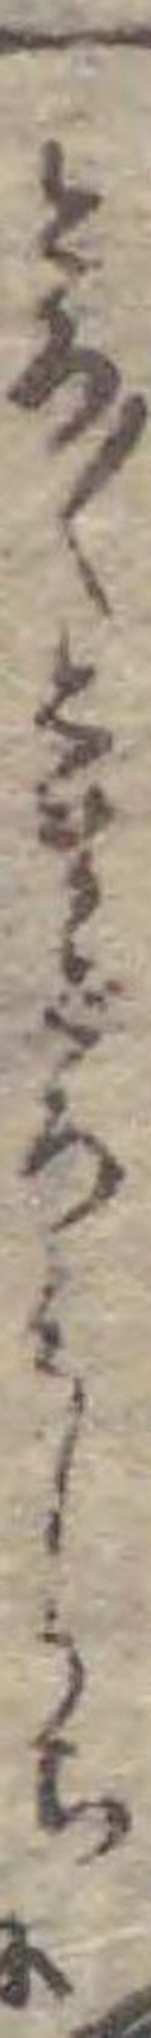とろ〳〵とまどろみしうちに
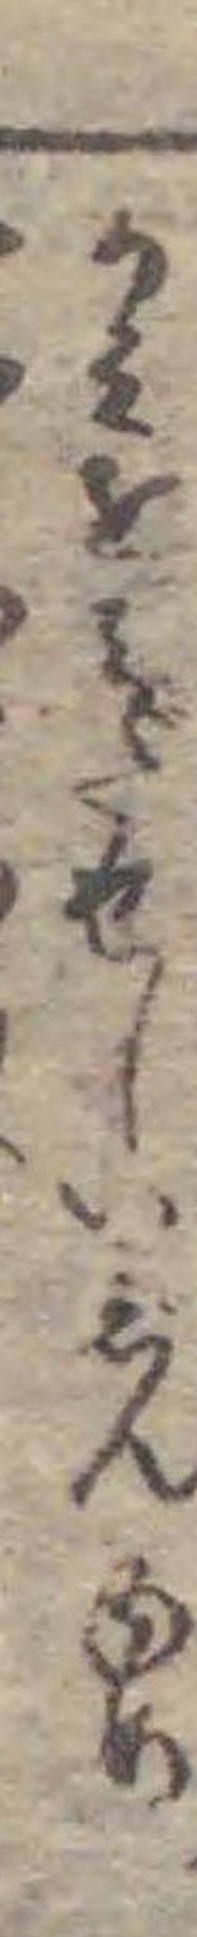かみをみだせしいじんゆめ
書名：[化物一代記] : 5巻
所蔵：国立国会図書館 National Diet Library, JAPAN
